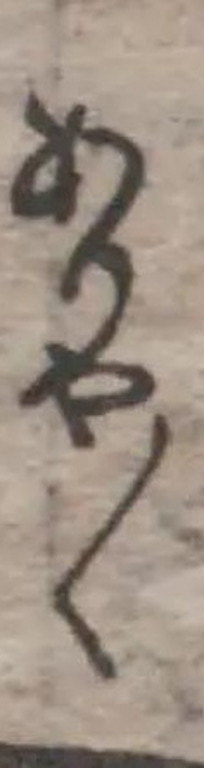ありや〳〵
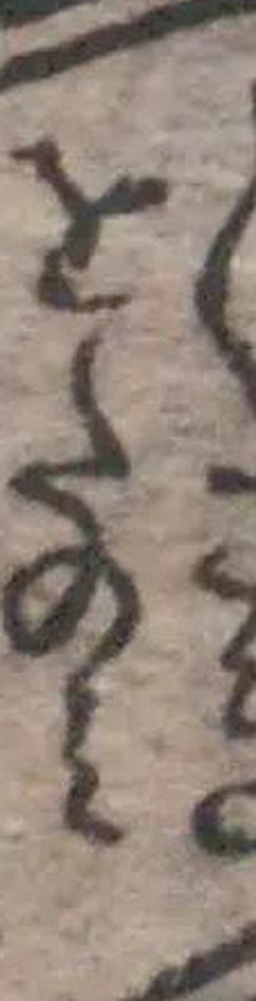をたのみ
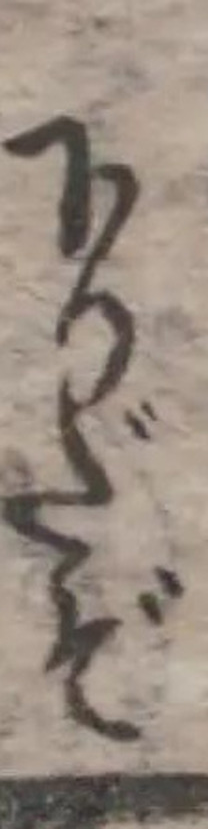下りだぞ
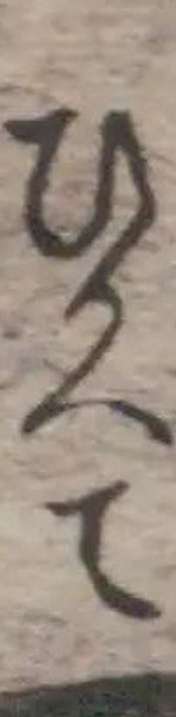ひかへて
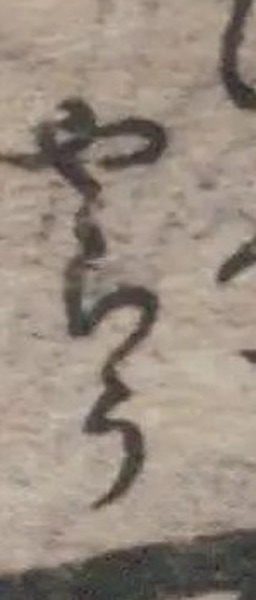やらう
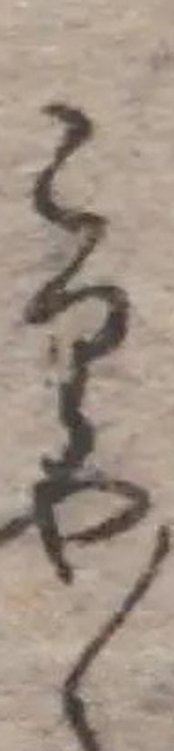こりや〳〵

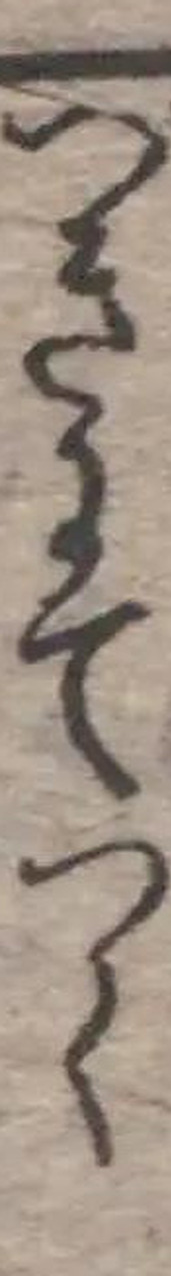づきにてつく
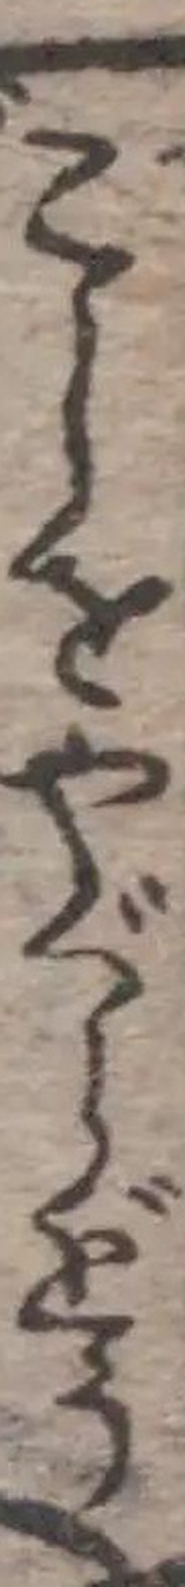こしをやぐらどう
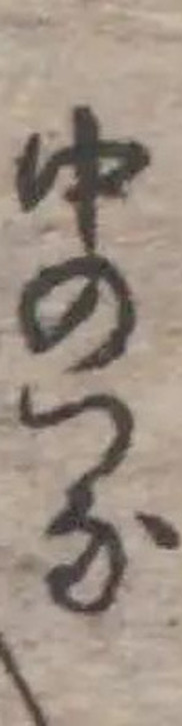中のつな
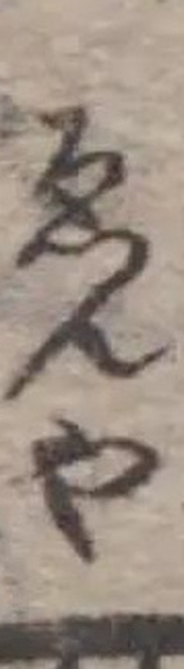ゑんや
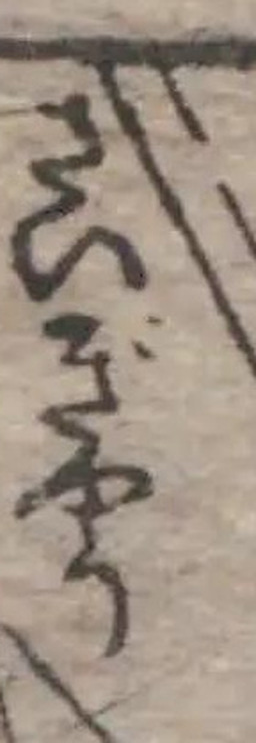さいぎやう
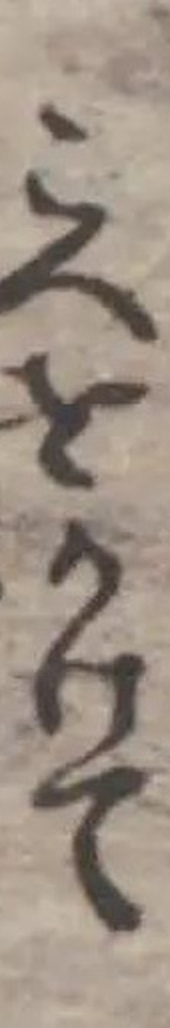こへをかけて
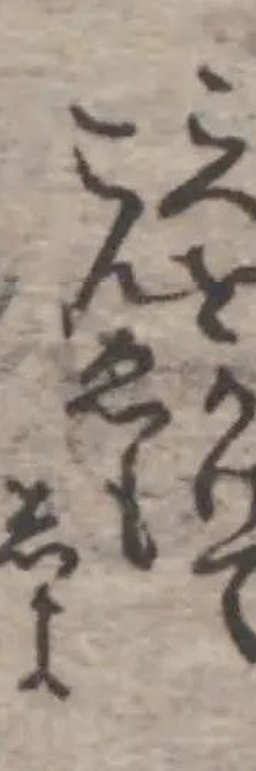こんゑもしよ
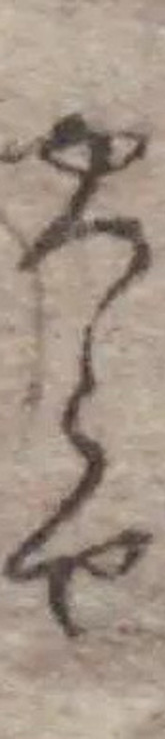やつとせ
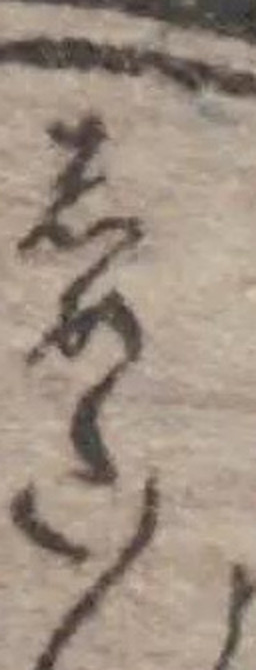しめた〳〵

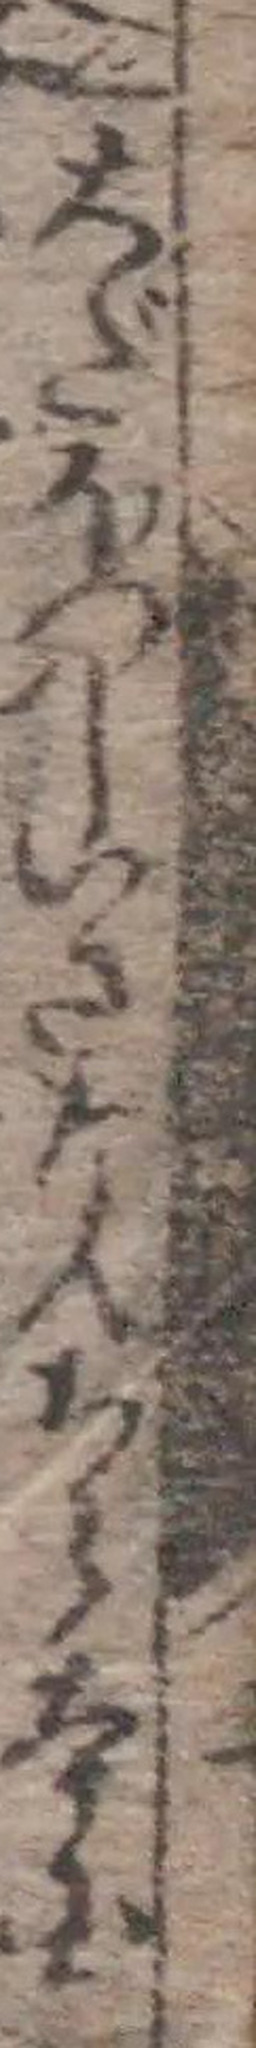大だほつしいさなんちう本国
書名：五たいそう
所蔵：国立国会図書館 National Diet Library, JAPAN
